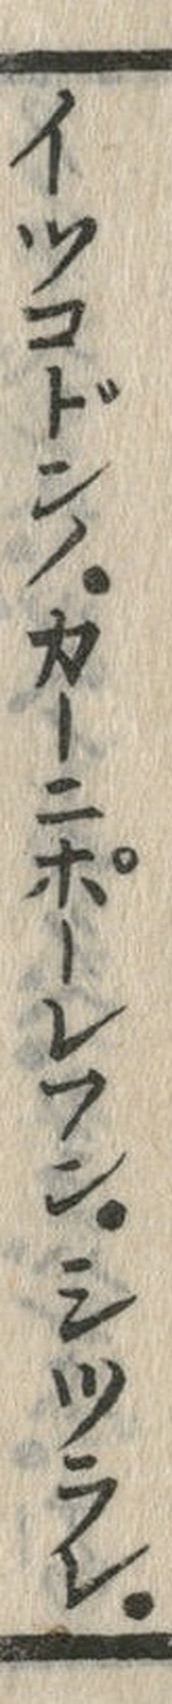イツコドンノ。カーニポーレフン。シツラレ。
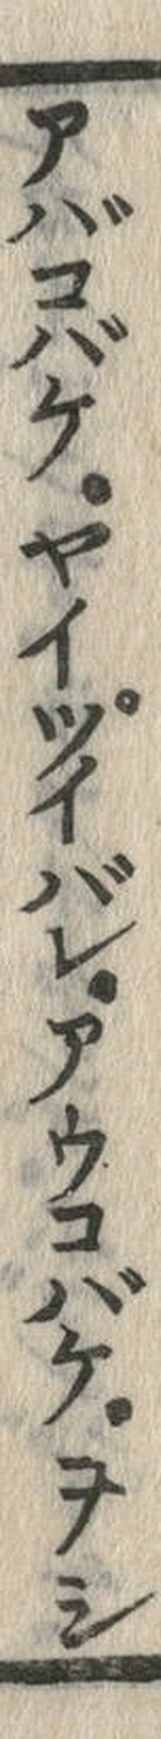アバコバケ。ヤイツ゚イバレ。アウコバケ。ヲシ
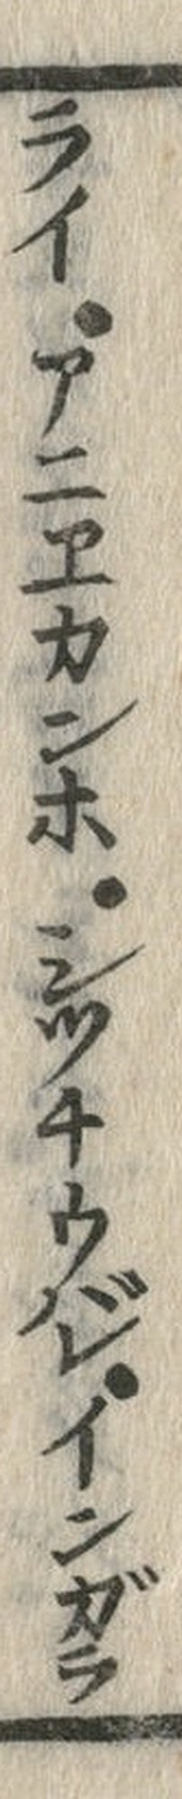ライ。アニヱカンホ。シツチウバレ。インガラ
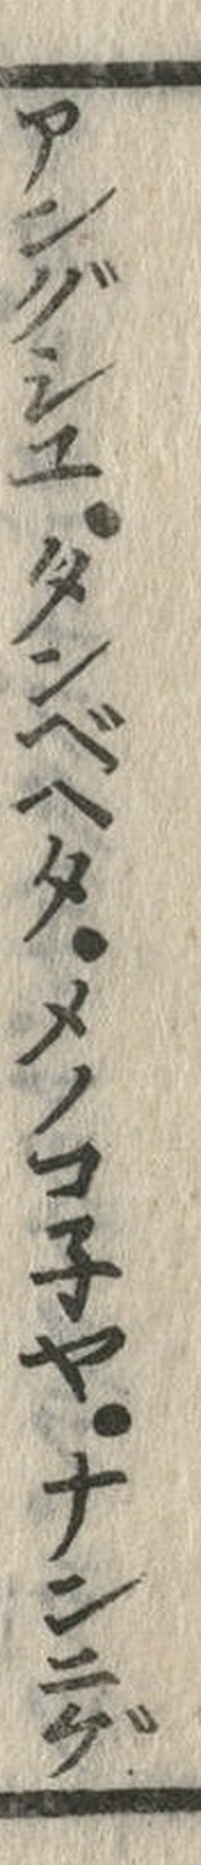アングシユ。タンベヘタ。メノコネヤ。ナンニゲ

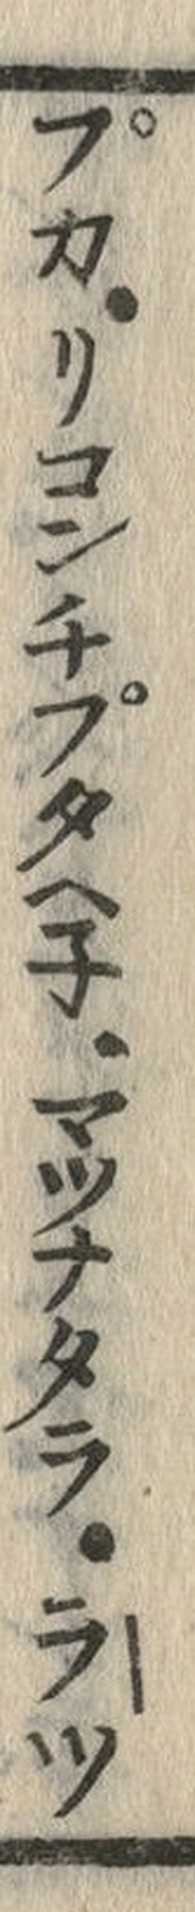プカ。リコンチプタヘネ。マツナタラ。ラツ
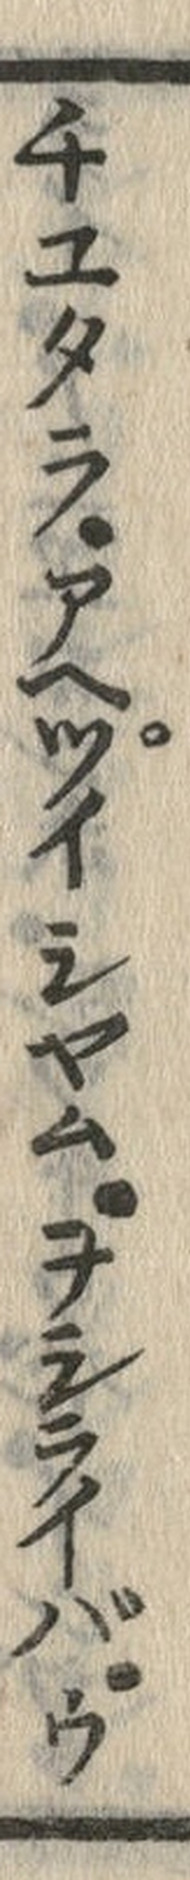チユタラ。アヘツ゚イシヤム。ヲシライバ。ウ
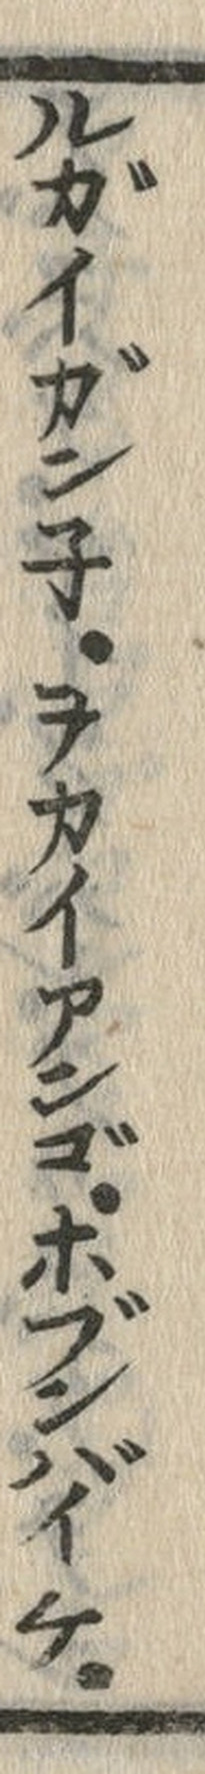ルガイガンネ。ヲカイアンゴ。ホブンバイケ。
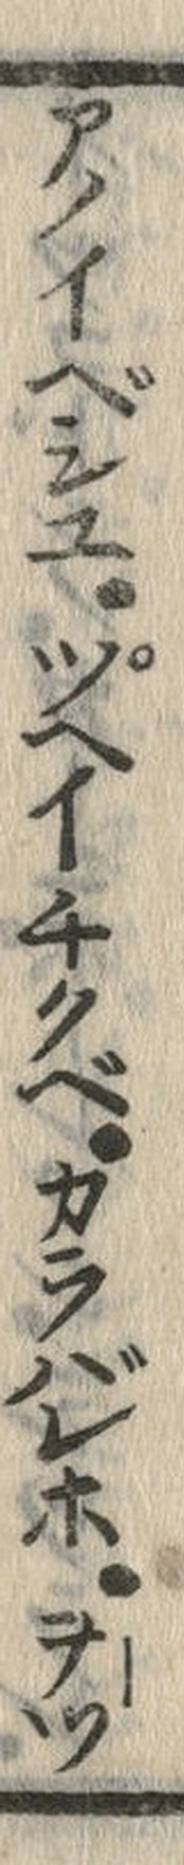アノイベシユ。ツ゚ヘイチクベ。カラバレホ。ヲツ
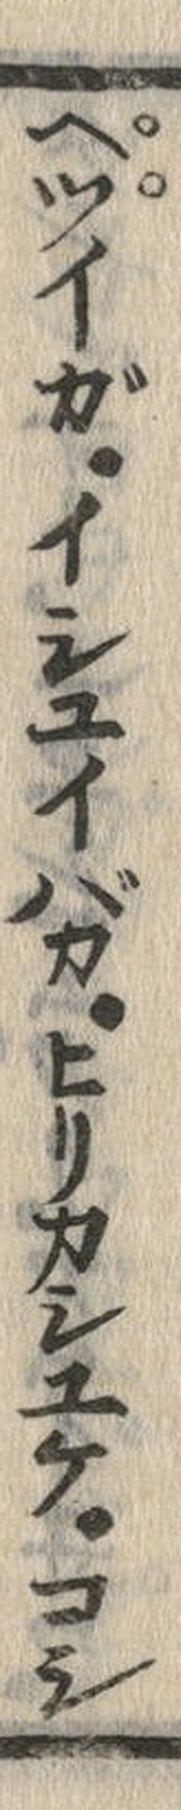ペツ゚イガ。イシユイバカ。ヒリカシユケ。コシ
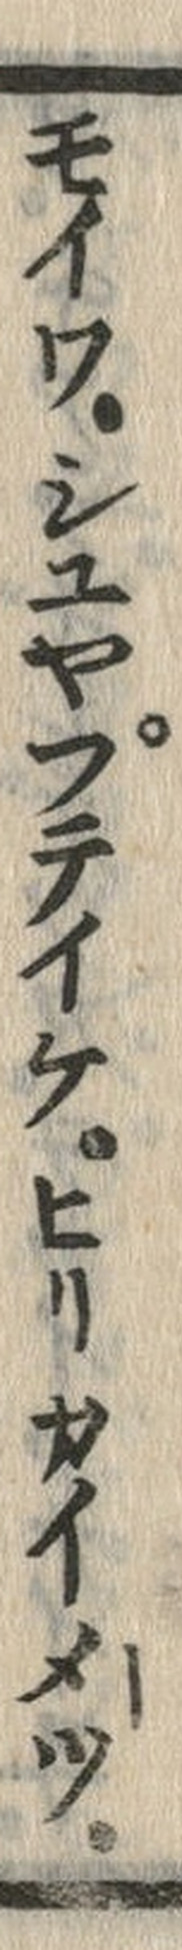モイワ。シユヤプテイケ。ヒリカイメツ。
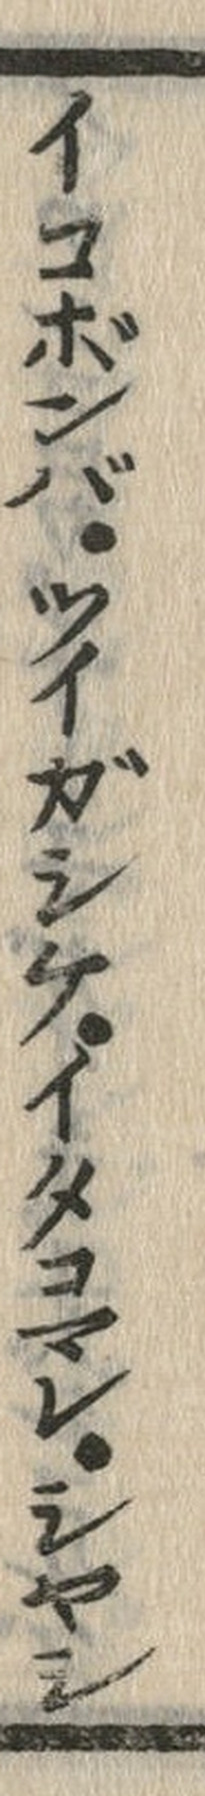イコボンバ。ツイガシケ。イタコマレ。シヤシ
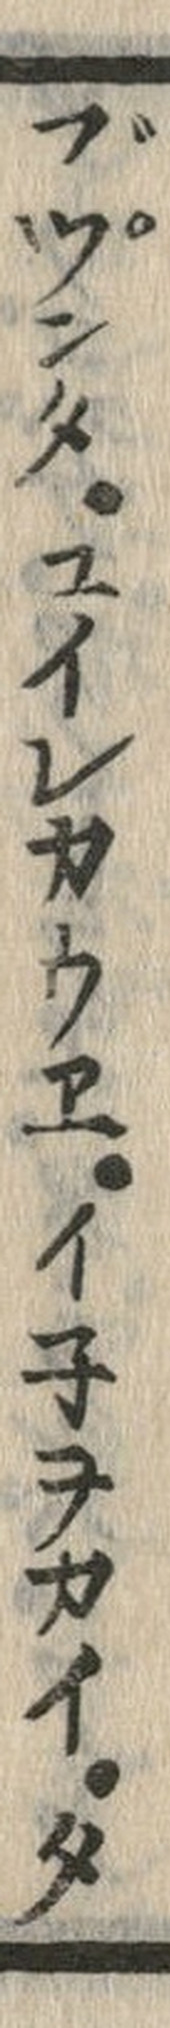ブツ゚ンタ。ユイレカウヱ。イネヲカイ。タ

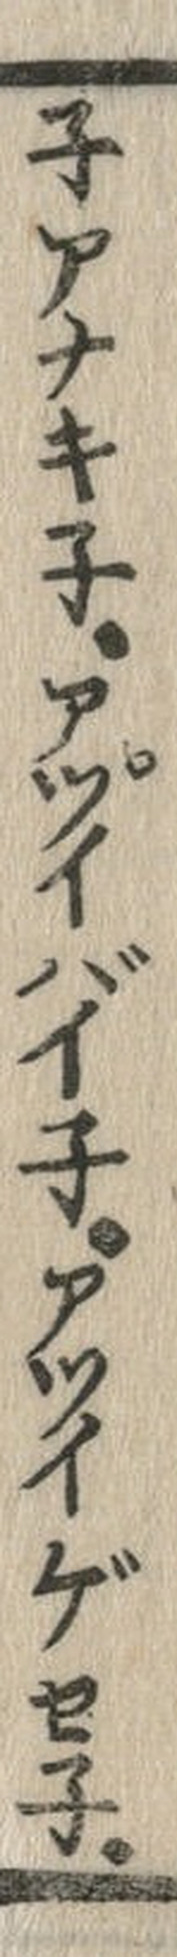ネアナキネ。アツ゚イバイネ。アツイゲセネ。
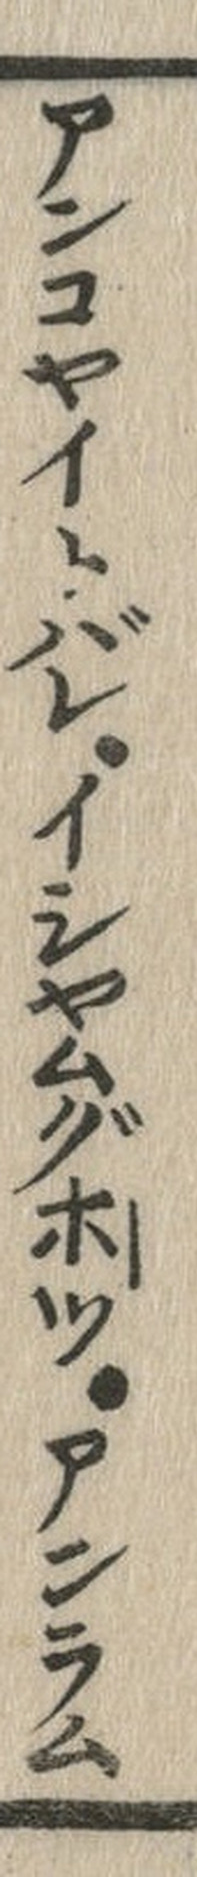アンコヤイトバレ。イシヤムグホツ。アンラム
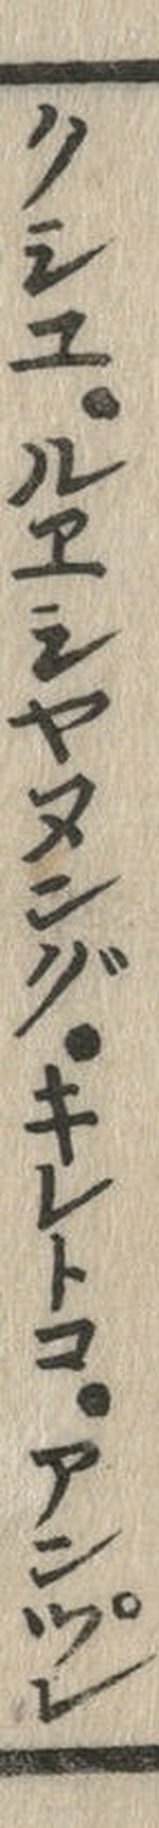クシユ。ルヱシヤヌング。キレトコ。アンツ゚レ
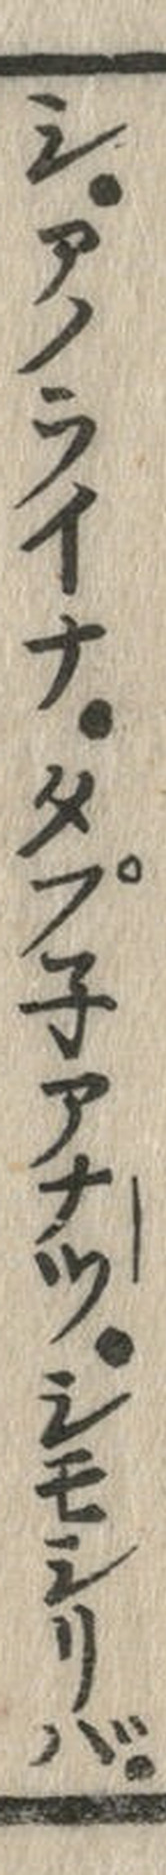シ。アノライナ。タプネアナツ。シモシリバ。
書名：蝦夷方言藻汐草　坤巻
